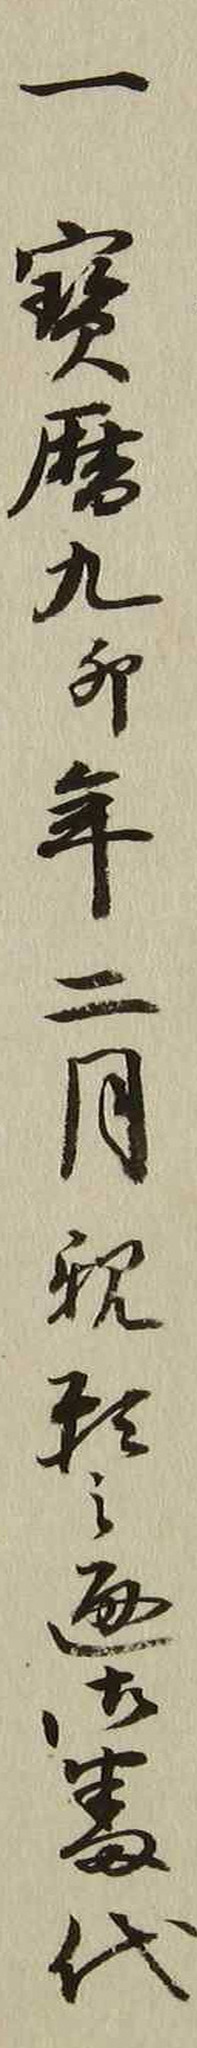一宝暦九卯年二月親願之通御番代
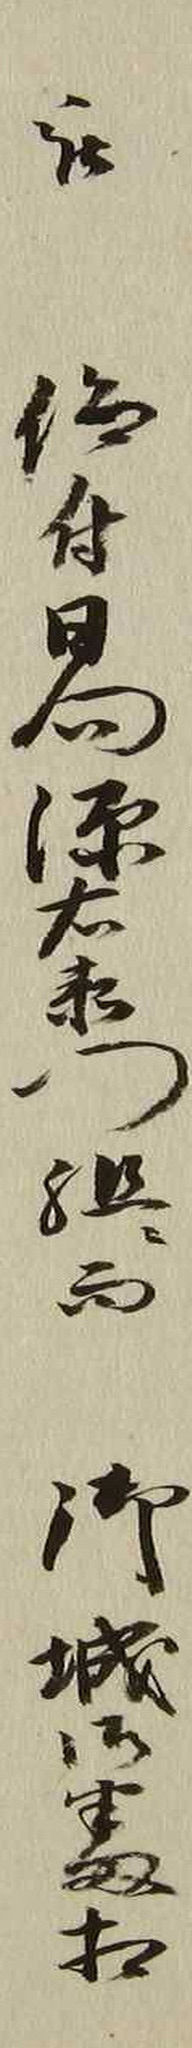被仰付日向源右衛門組ニ而御城御番相
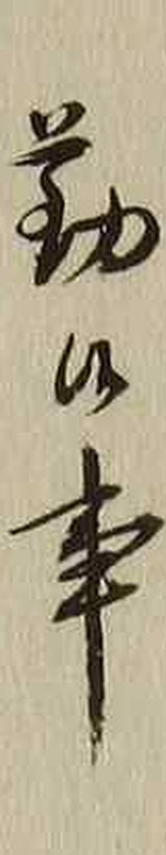勤候事
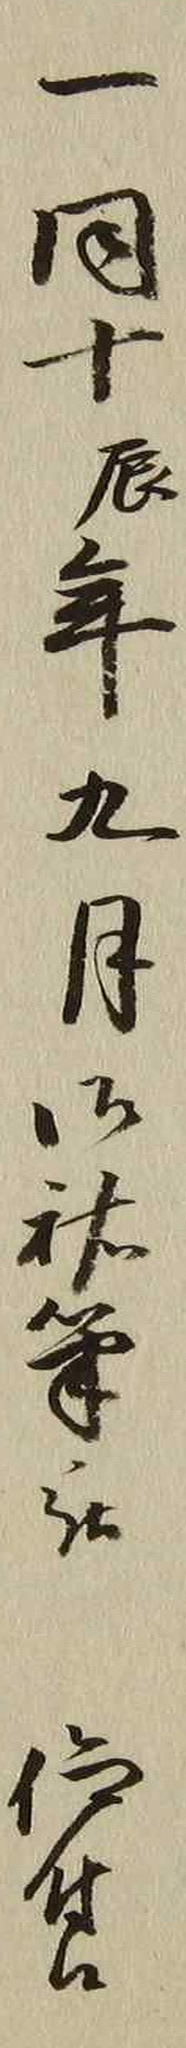一同十辰年九月御祐筆被仰付候
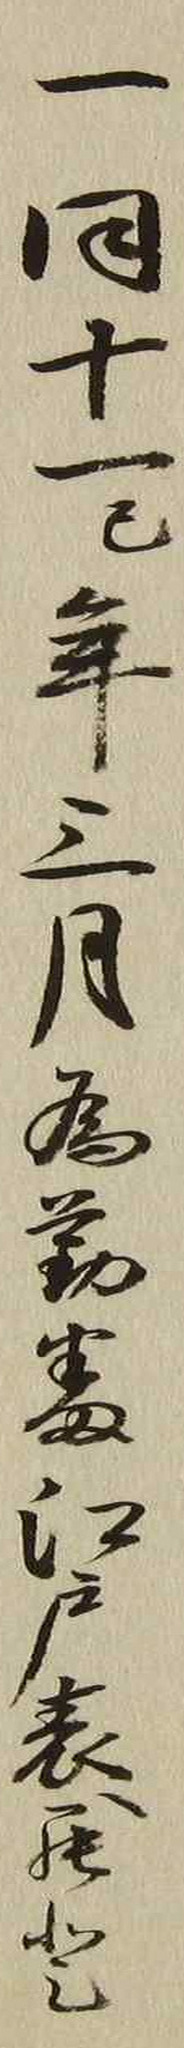一同十一巳年三月為勤番江戸表へ罷登
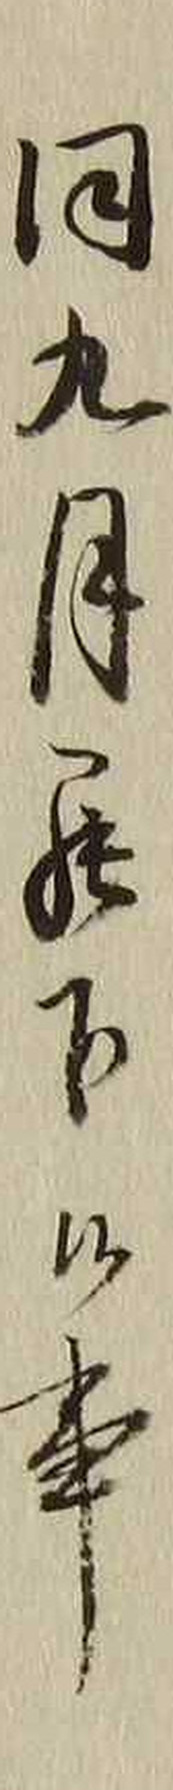同九月罷下候事
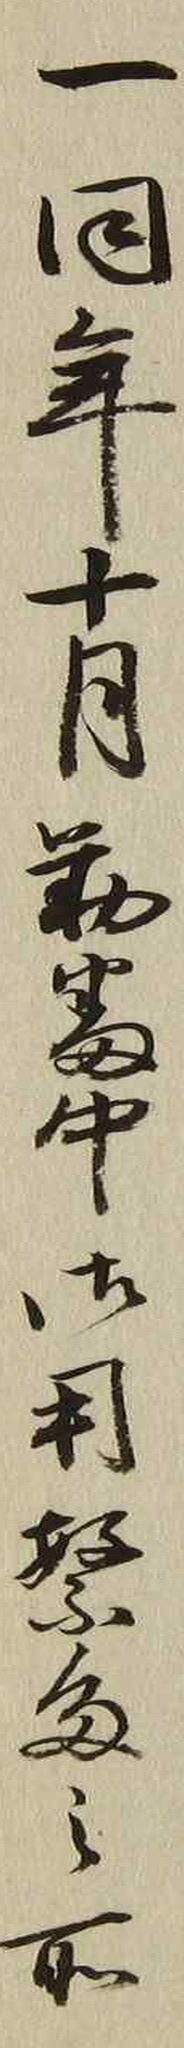一同年十月勤番中御用繁多之所
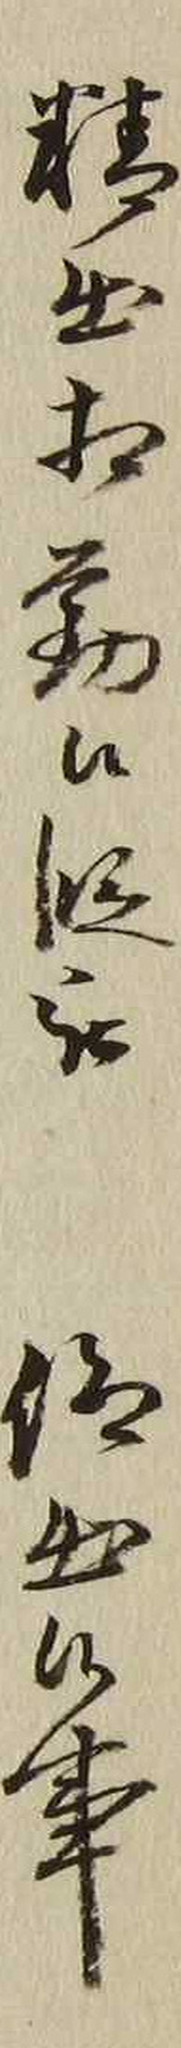精出相勤候段被仰出候事
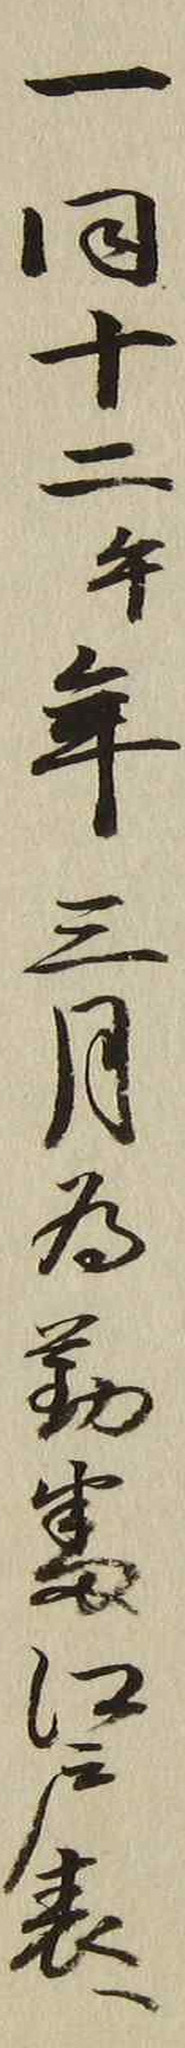一同十二午年三月為勤番江戸表へ
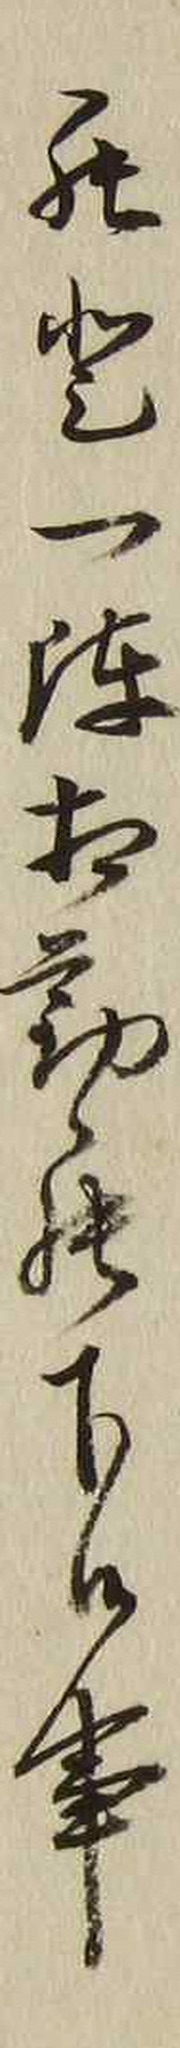罷登一陣相勤罷下候事
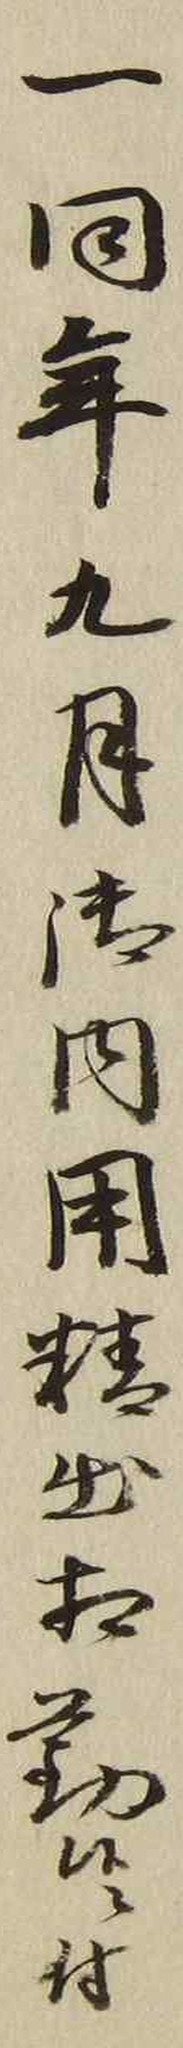一同年九月御内用精出相勤候ニ付

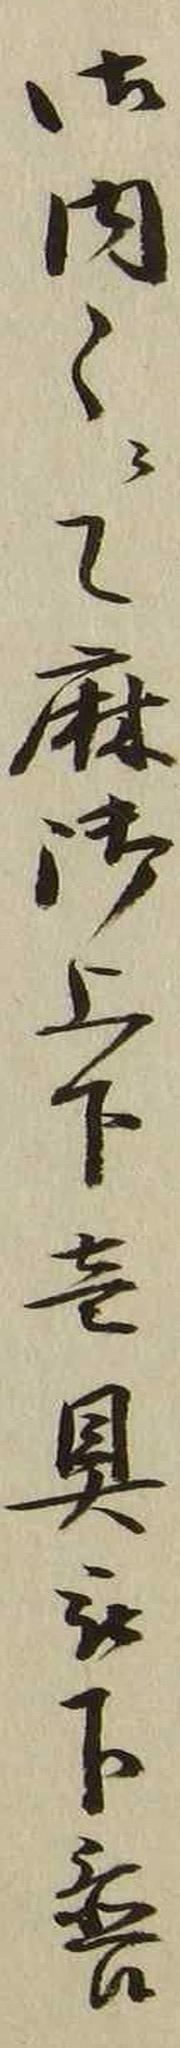御内々ニて麻御上下壱具被下置候
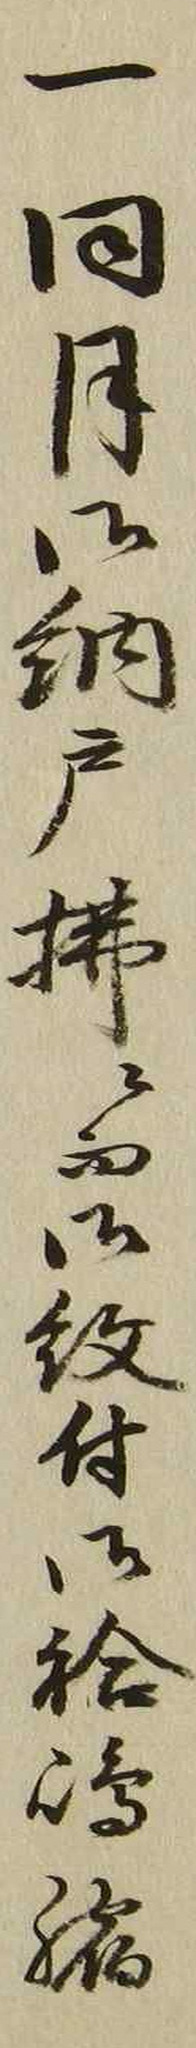一同月御納戸払ニ而御紋付御袷嶋縮
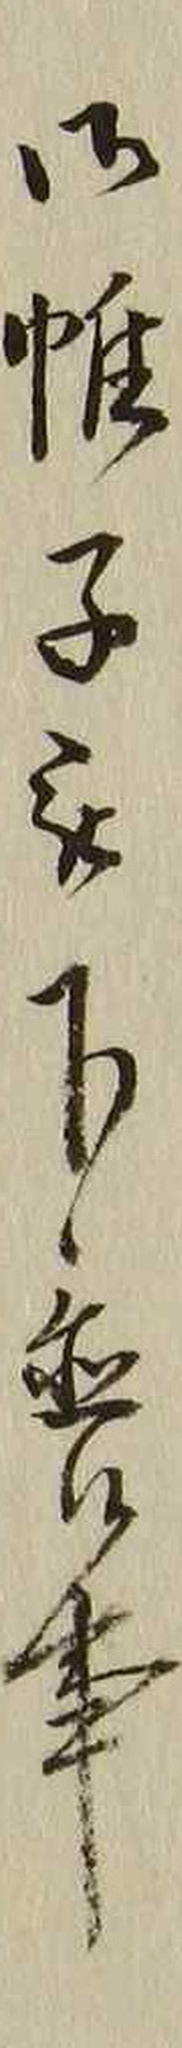御帷子被下置候事
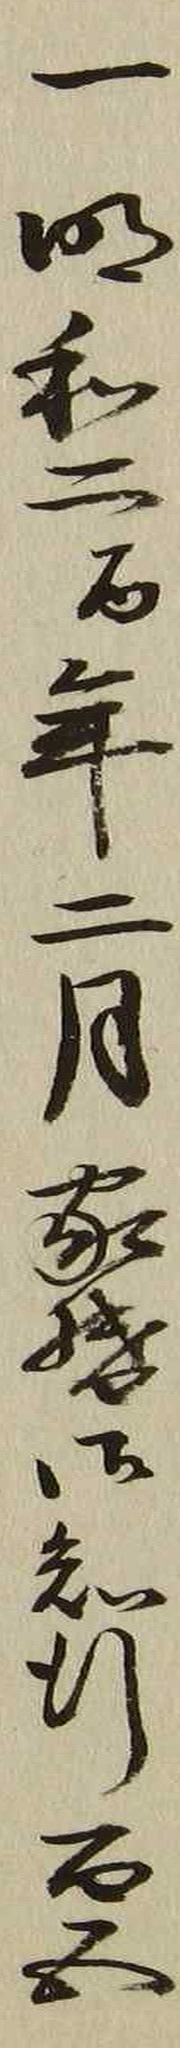一明和二酉年二月家督御知行百五
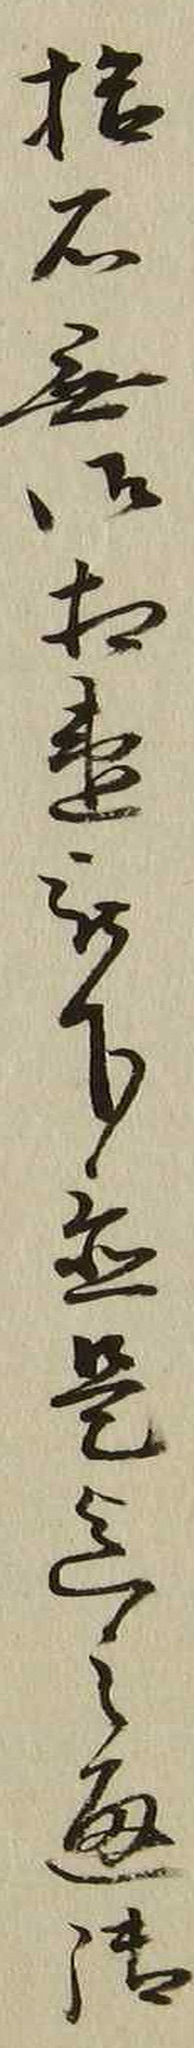拾石無御相違被下置是迄之通御
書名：諸士系譜　巻之61　と之部4
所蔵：会津若松市立会津図書館
